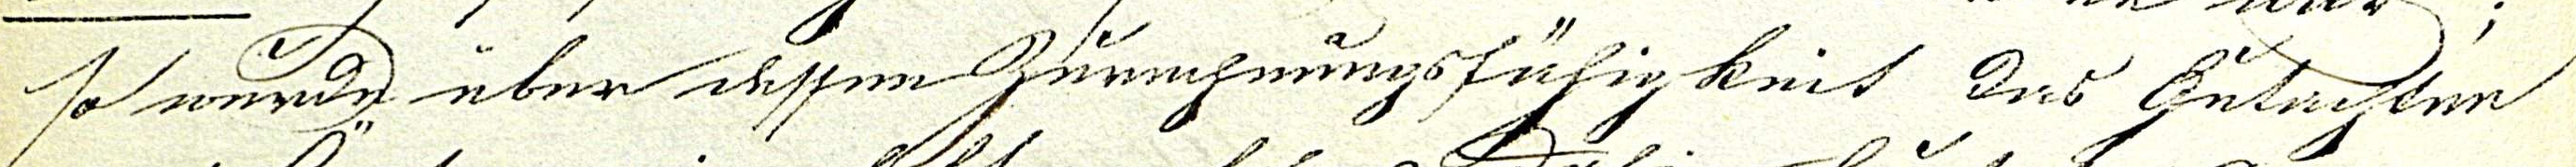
so wurde über dessen Zurechnungsfähigkeit das Gutachten
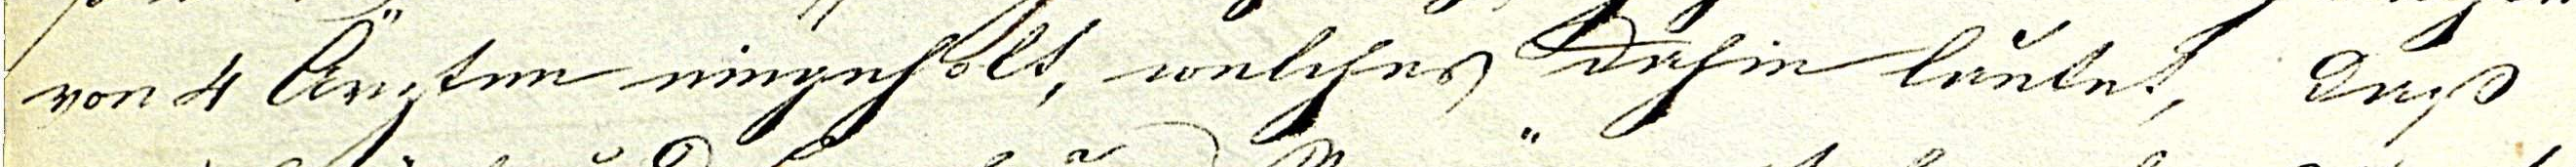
von 4 Ärzten eingeholt, welches dahin lautet, daß
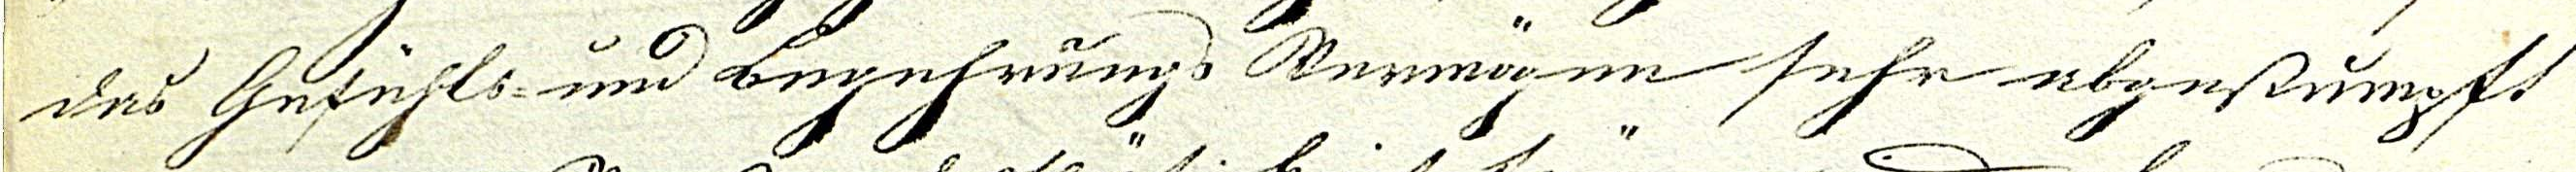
das Gefühls- und Begehrungs Vermögen sehr abgestumpft
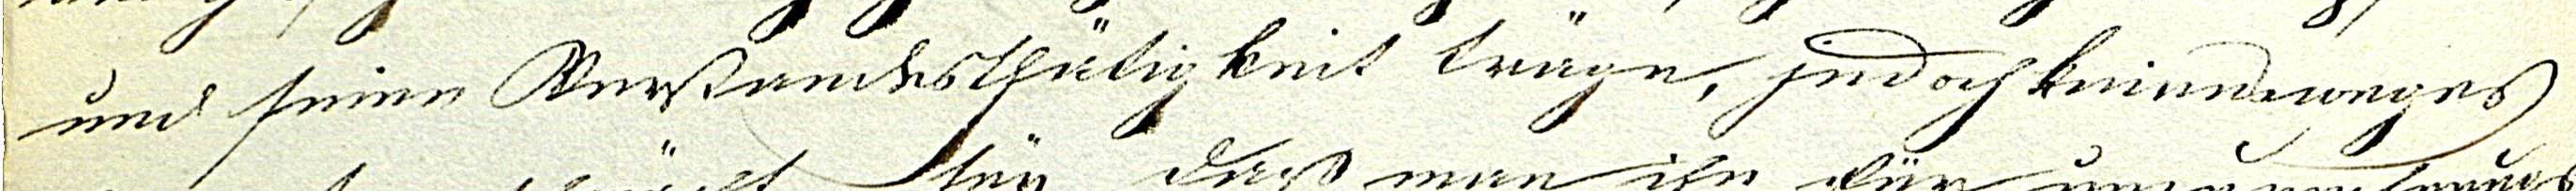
und seine Verstandesthätigkeit träge, jedoch keinesweges
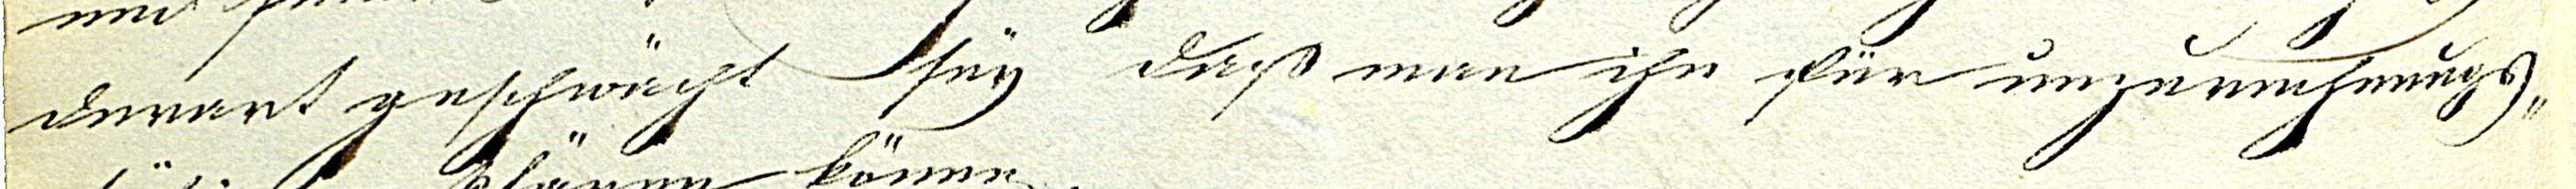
derart geschwächt sey daß man ihn für unzurechnungs¬
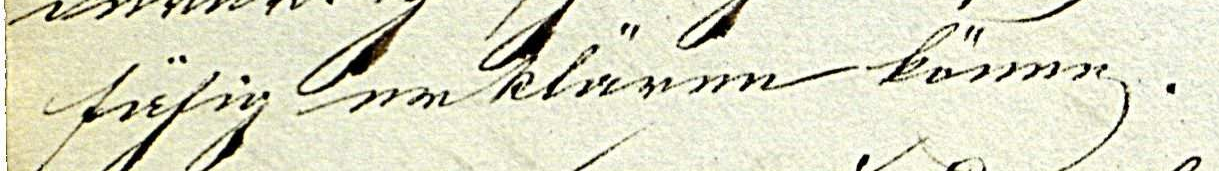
fähig erklären könne.
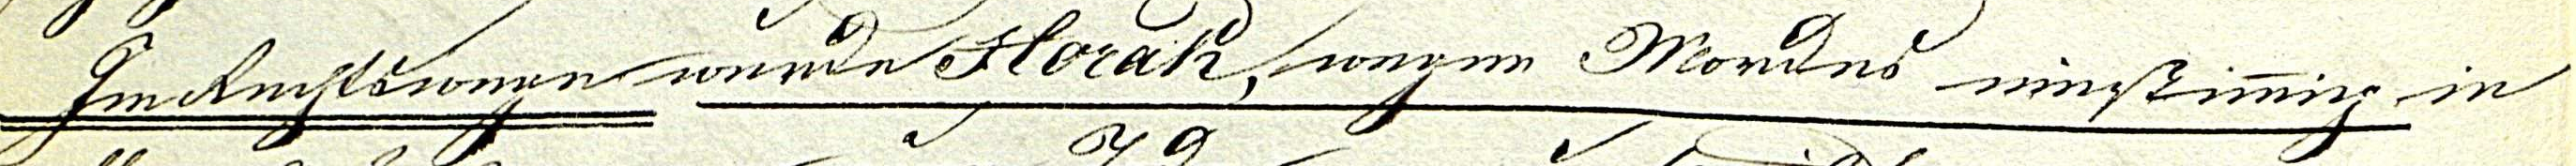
Im Rechtswege wurde Horak, wegen Mordes einstimmig in
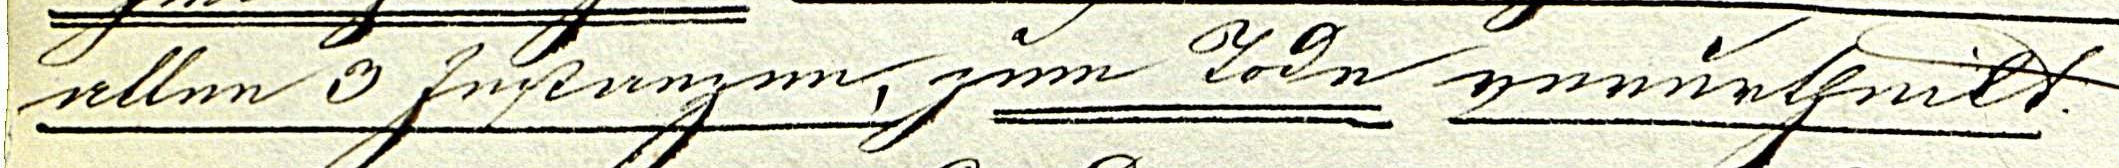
allen 3 Instanzen, zum Tode verurtheilt.
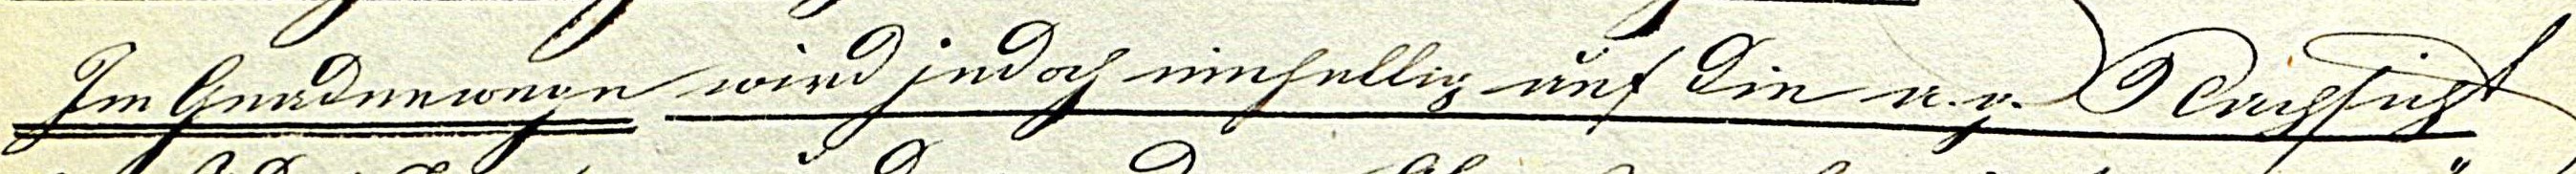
Im Gnadenwege wird jedoch einhellig auf die a.g. Nachsicht
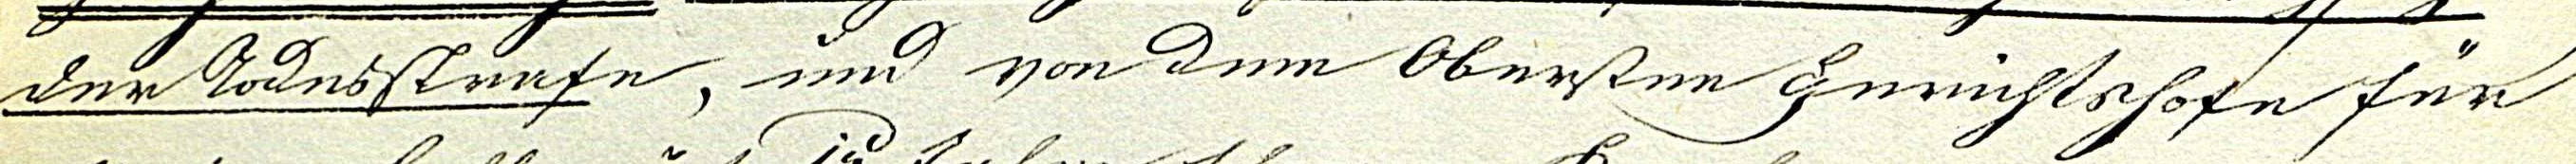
der Todesstrafe, und von dem Obersten Gerichtshofe für
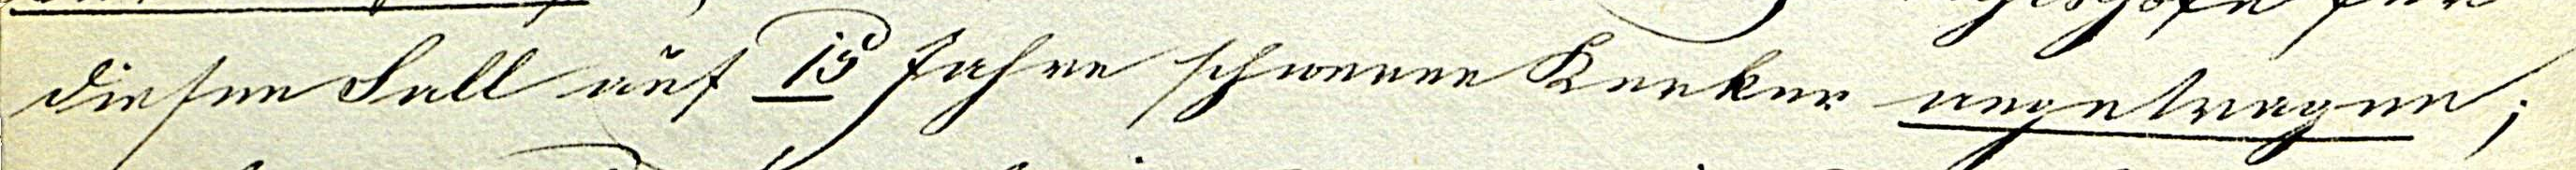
diesen Fall auf 15 Jahre schweren Kerker angetragen;
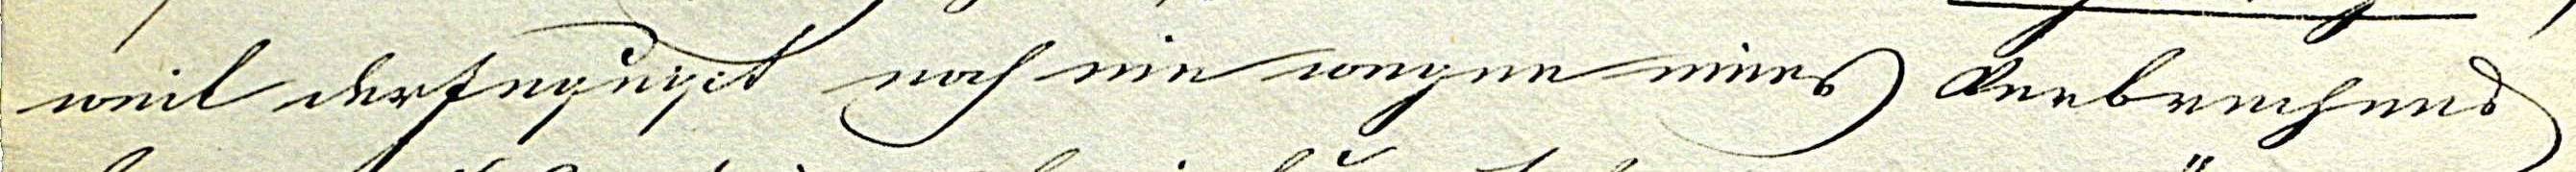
weil der Inquisit noch nie wegen eines Verbrechens
